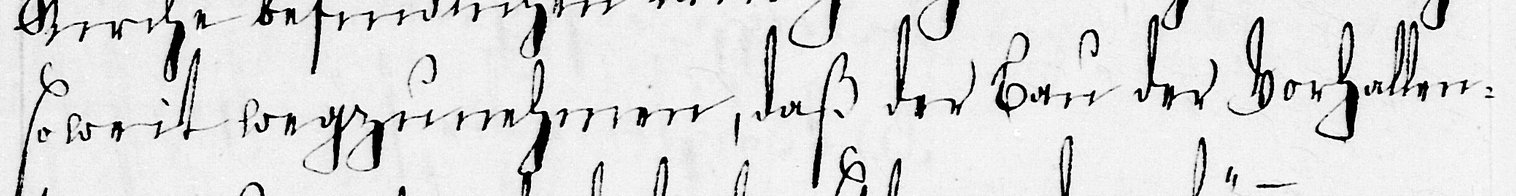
soweit wegzunehmen, daß der Bau der Vorhallen¬
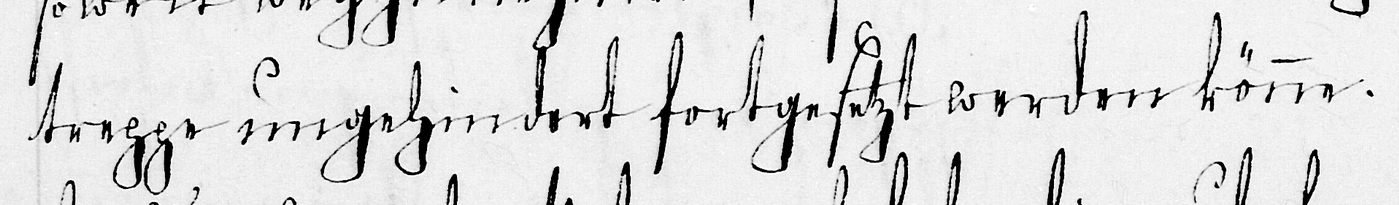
treppe ungehindert fortgesetzt werden könne.
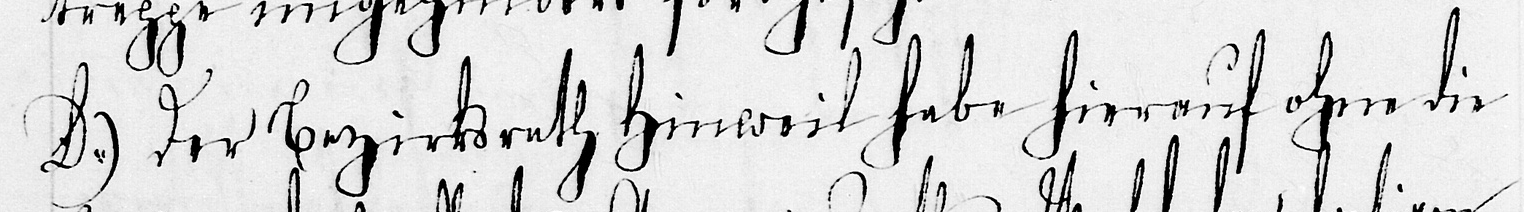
D.) Der Bezirksrath Hinweil habe hierauf ohne die
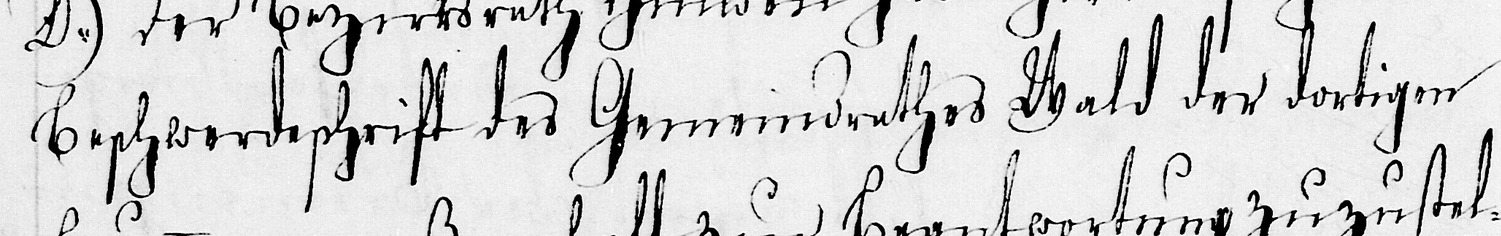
Beschwerdeschrift des Gemeindrathes Wald der dortigen
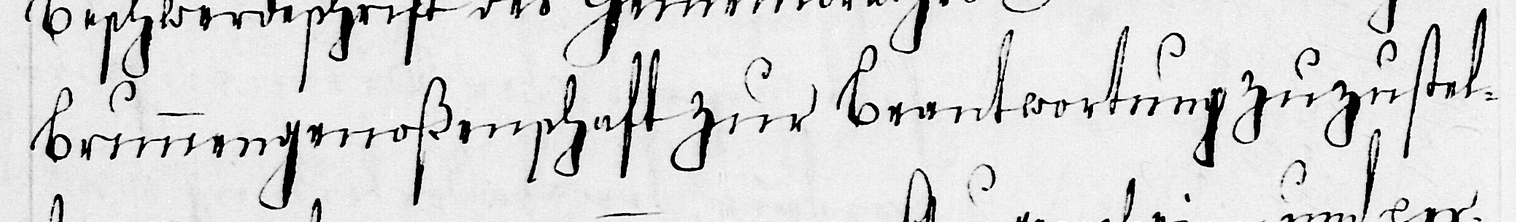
Brunnengenoßenschaft zur Beantwortung zuzustel¬
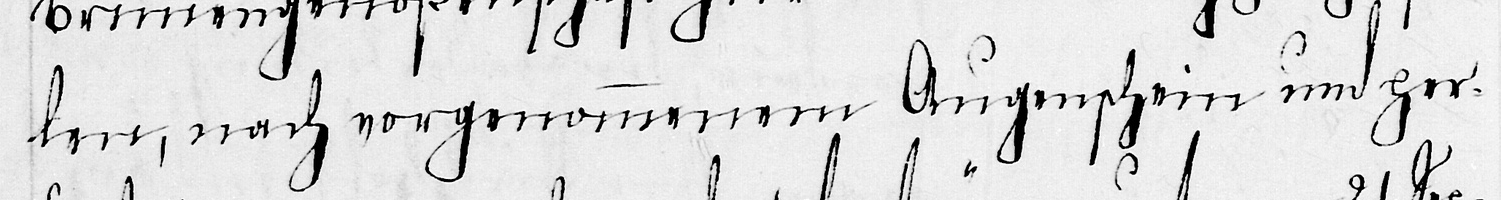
len, nach vorgenommenem Augenschein und per¬
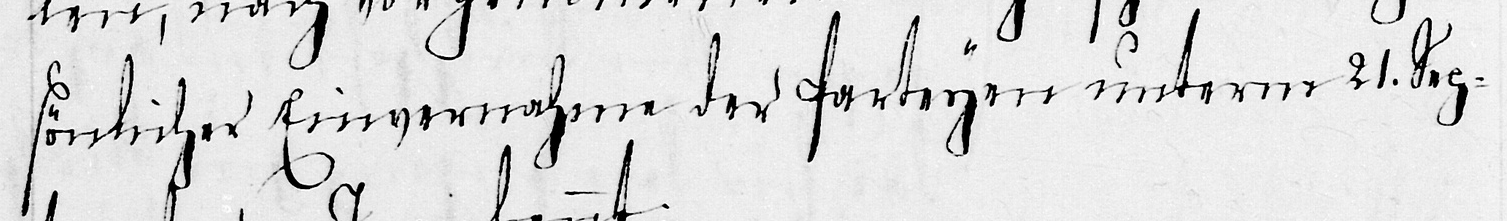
sönlicher Einvernahme der Parteyen unterm 21. Sep¬
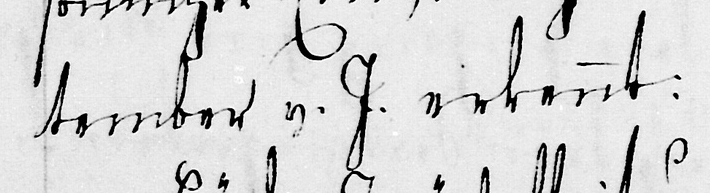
tember v. J. erkennt:
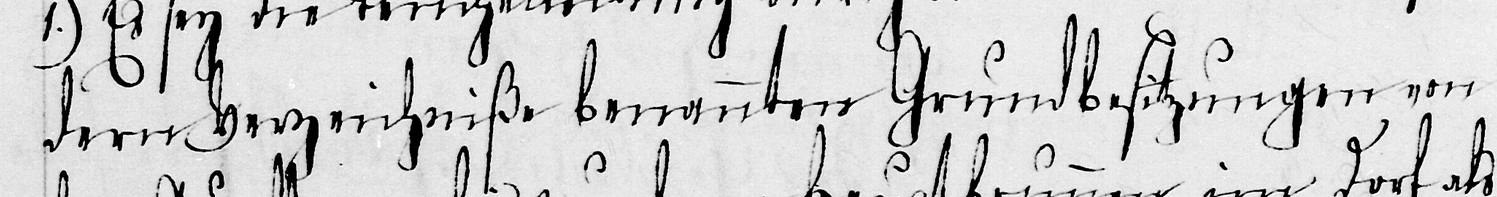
dern Verzeichniße benannten Grundbesitzungen von
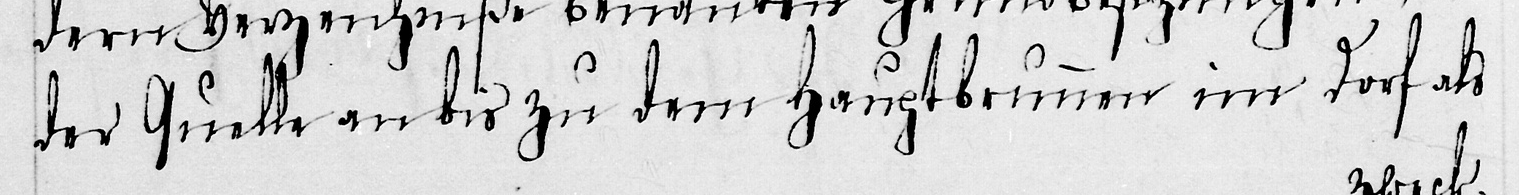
der Quelle an bis zu dem Hauptbrunnen im Dorf als
